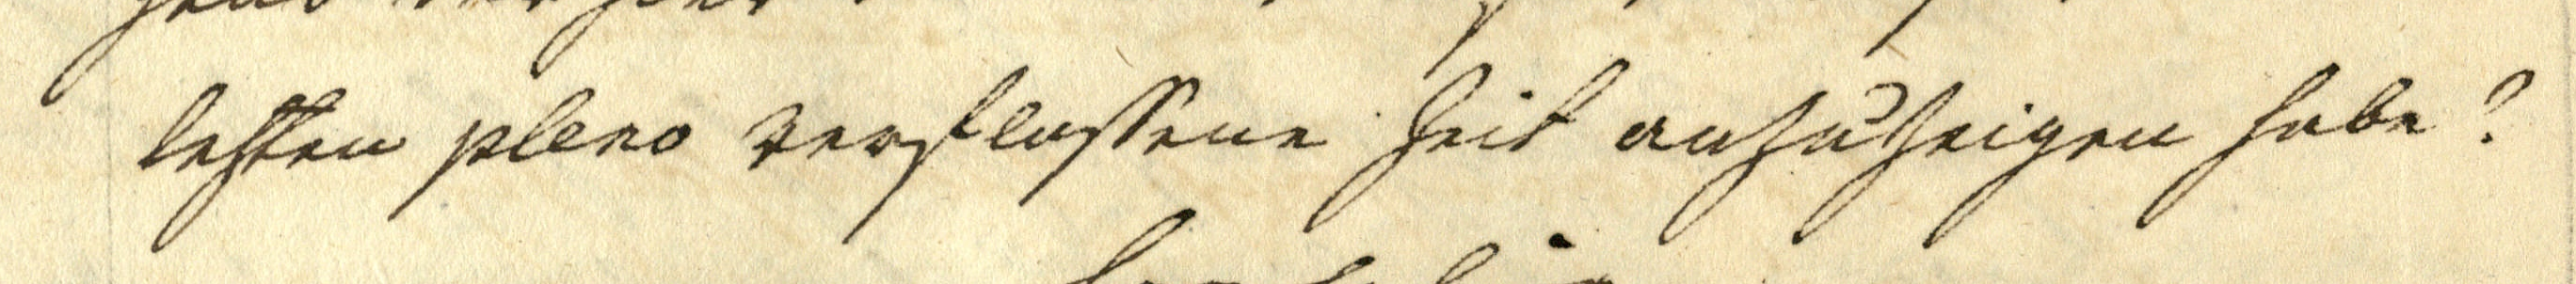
letzten pleno verflossene Zeit anzuzeigen habe?
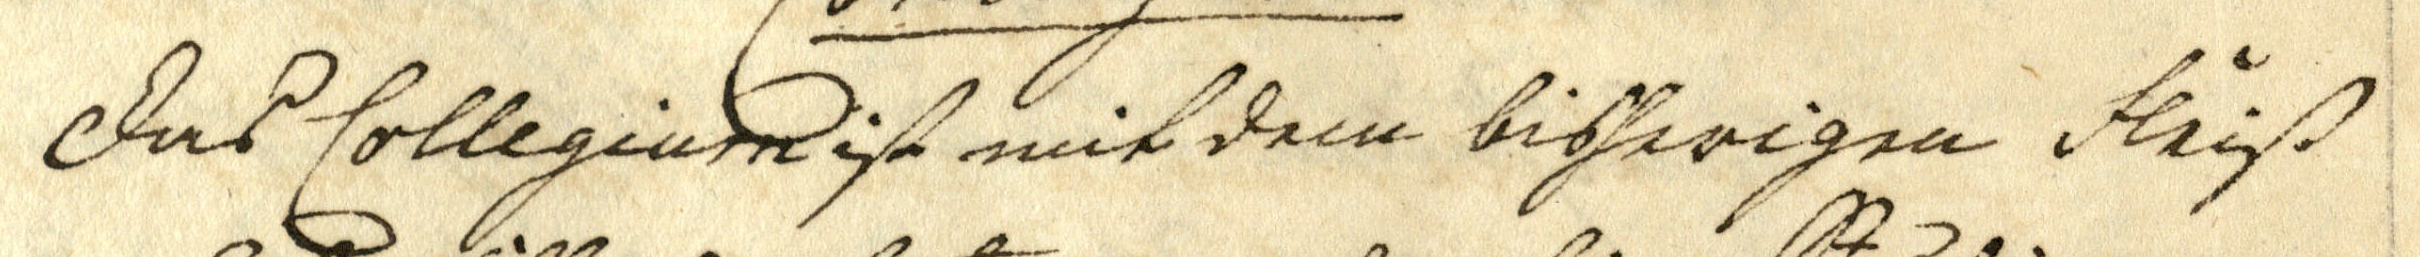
Das Collegium ist mit dem bisherigen Fleiß
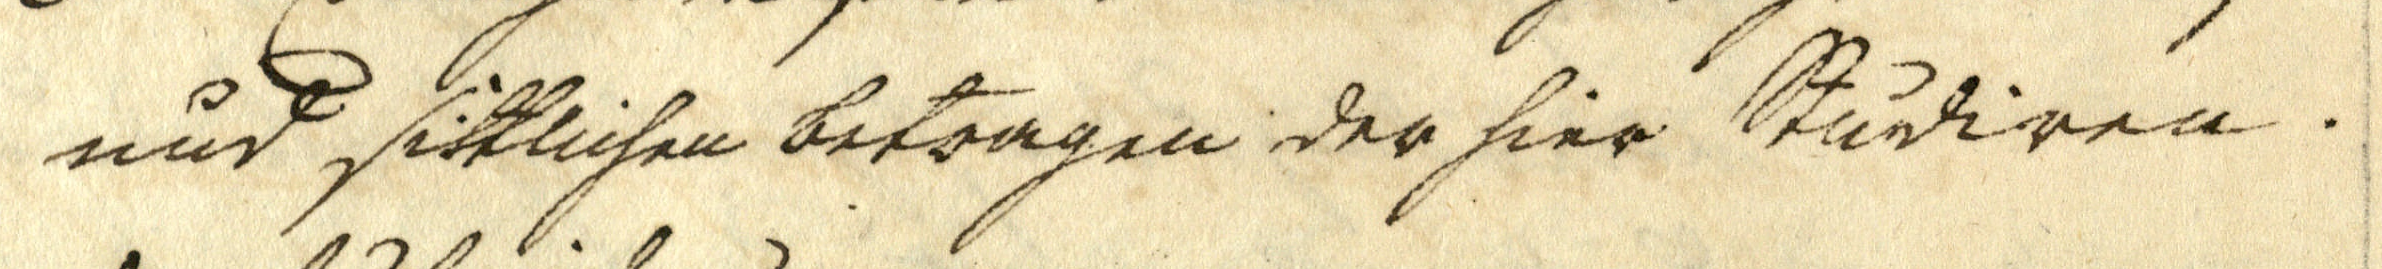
und sittlichen Betragen der hier Studiren¬
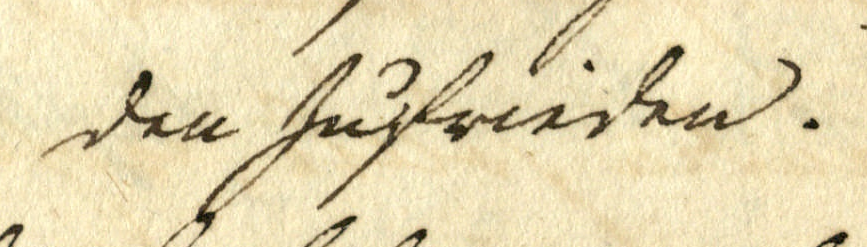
den zufrieden.
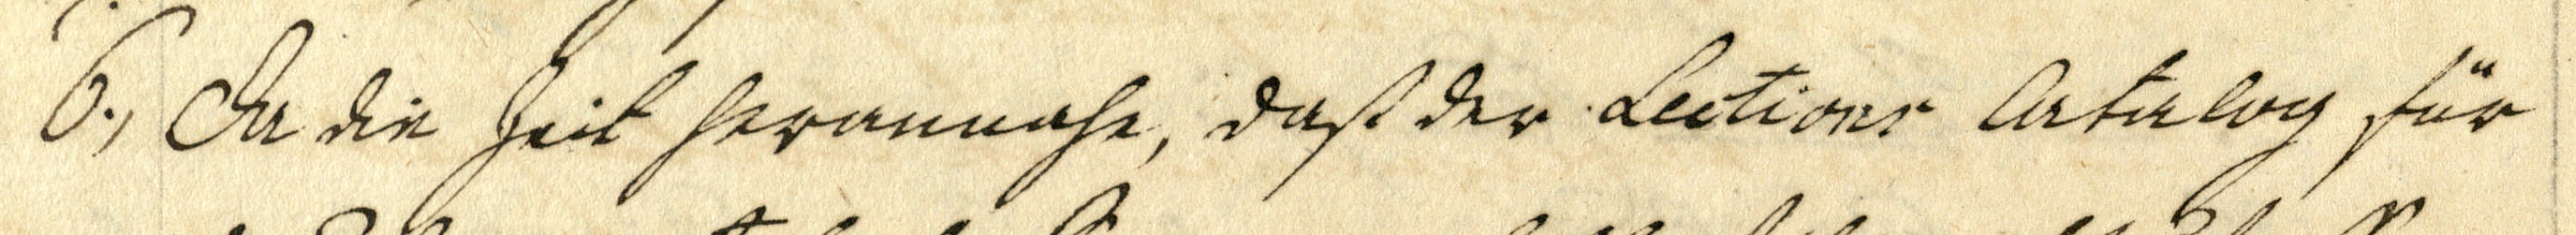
6., Da die Zeit herannahe, daß der Lections Catalog für
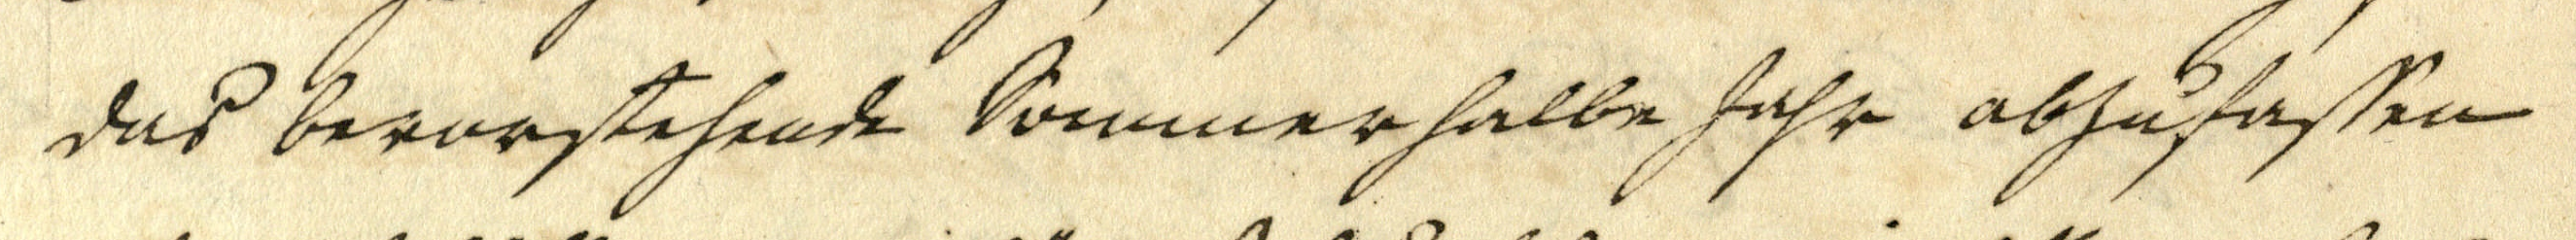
das bevorstehende Sommerhalbe Jahr abzufassen
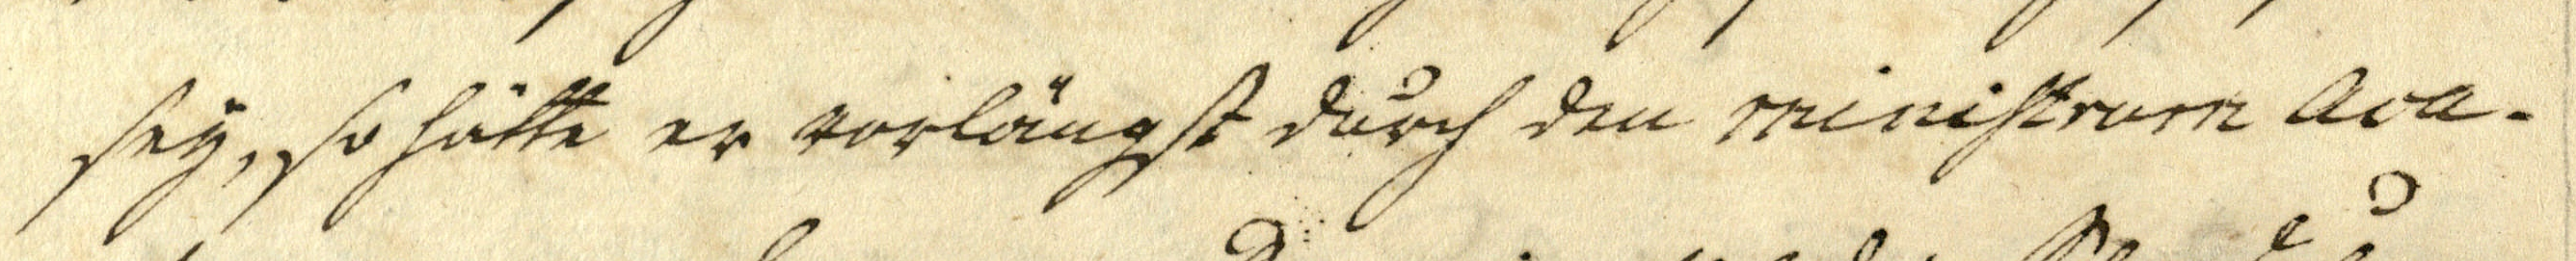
seÿ, so hätte er vorlängst durch den Ministrum Aca¬
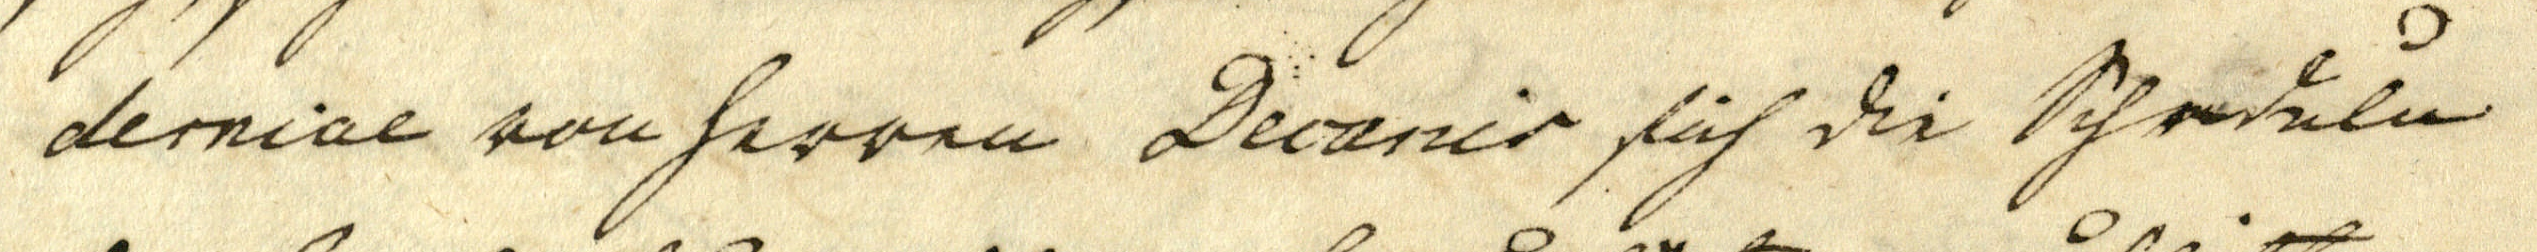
demiae von Herren Decanis sich die Scheduln
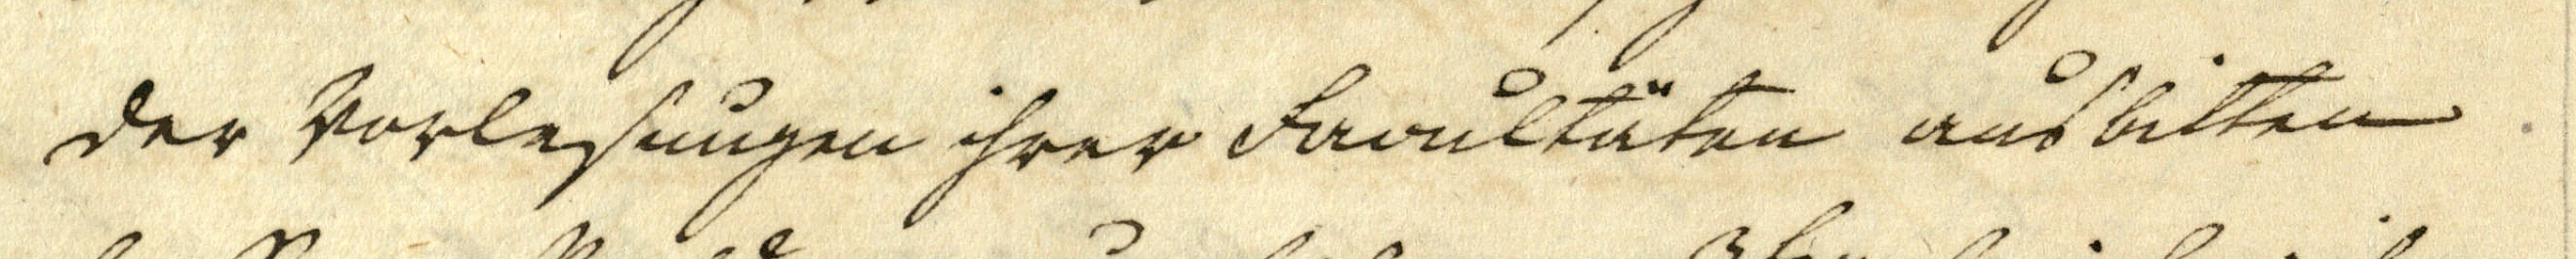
der Vorlesungen ihrer Facultäten aus bitten
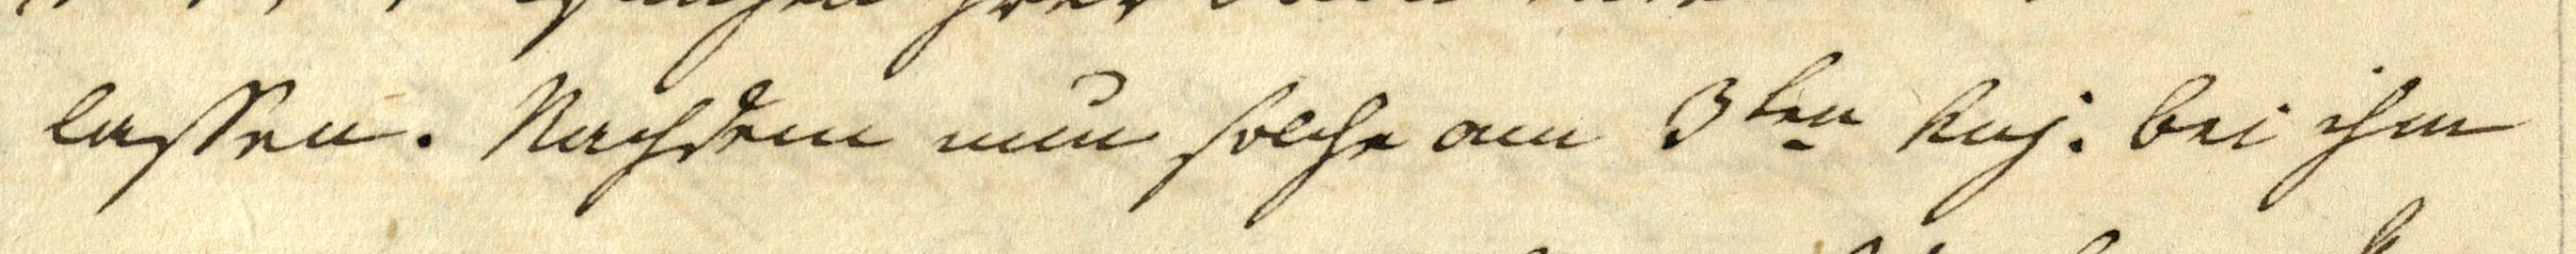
lassen. Nachdem nun solche am 3 ten huj. bei ihm
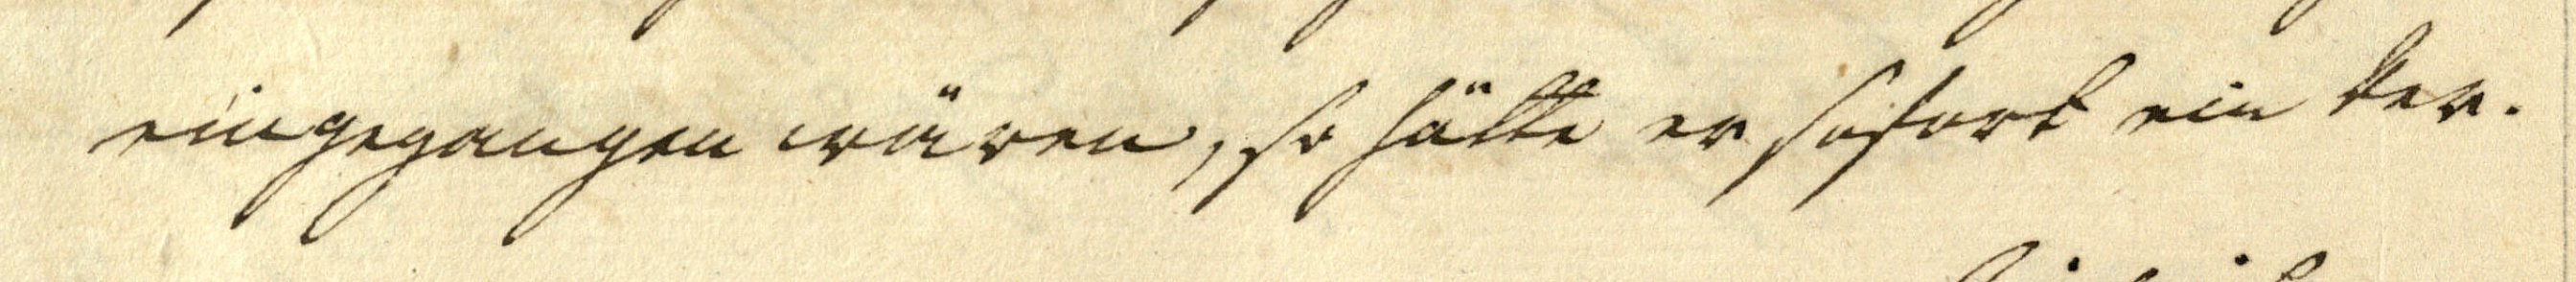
eingegangen wären, so hätte er sofort ein Ver¬
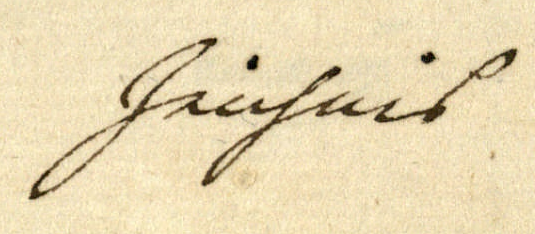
zeichnis
